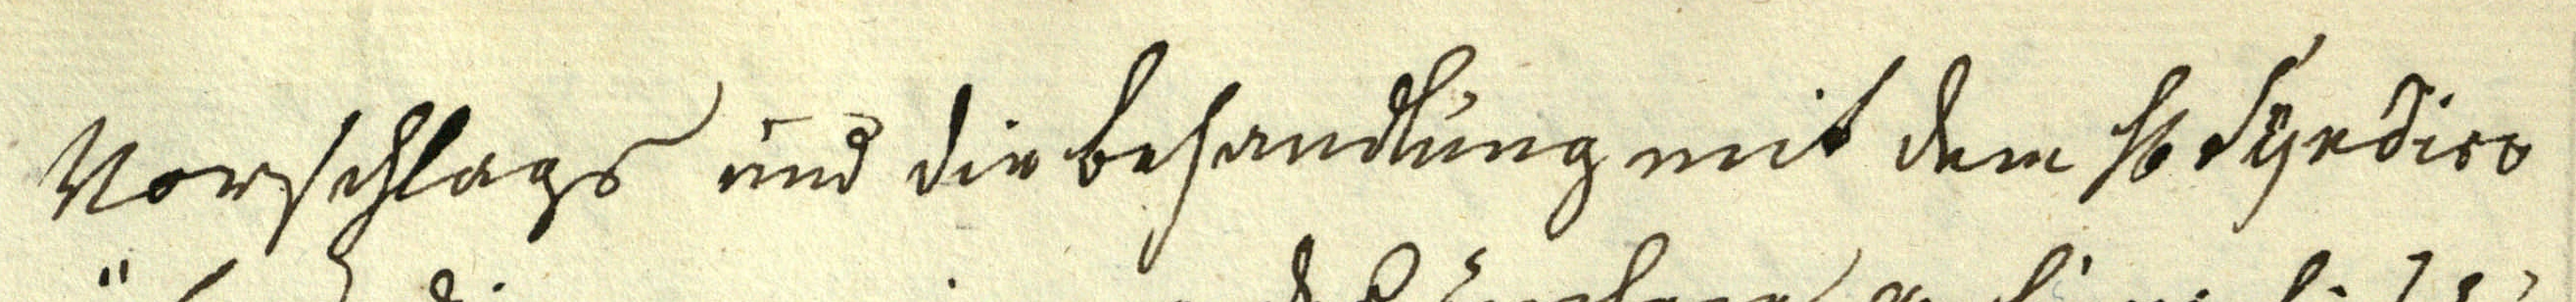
Vorschlages und die Behandlung mit dem H Sÿndico
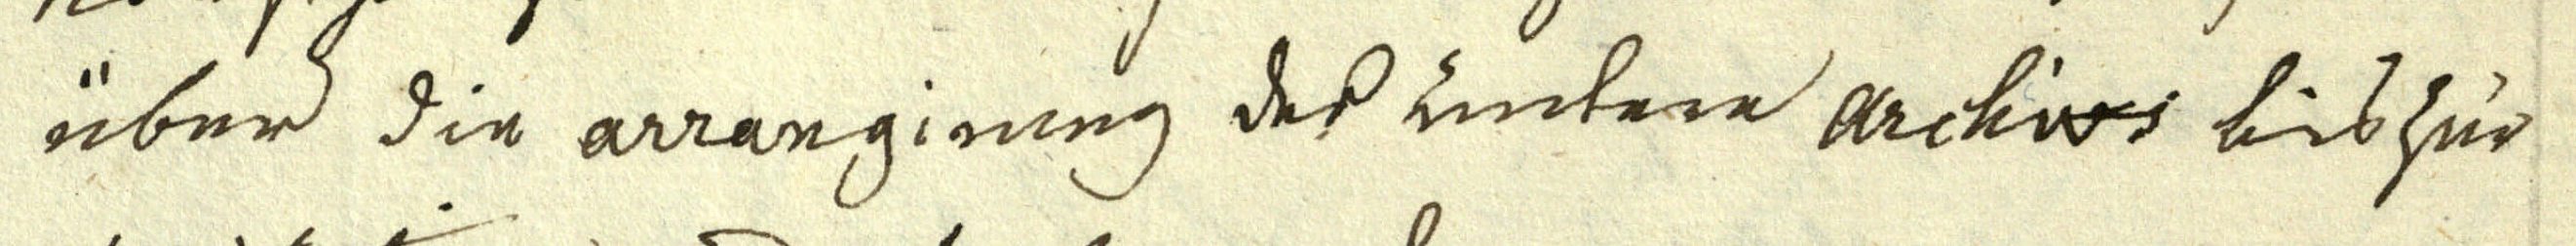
über die arrangirung der untern Archivs bis zur
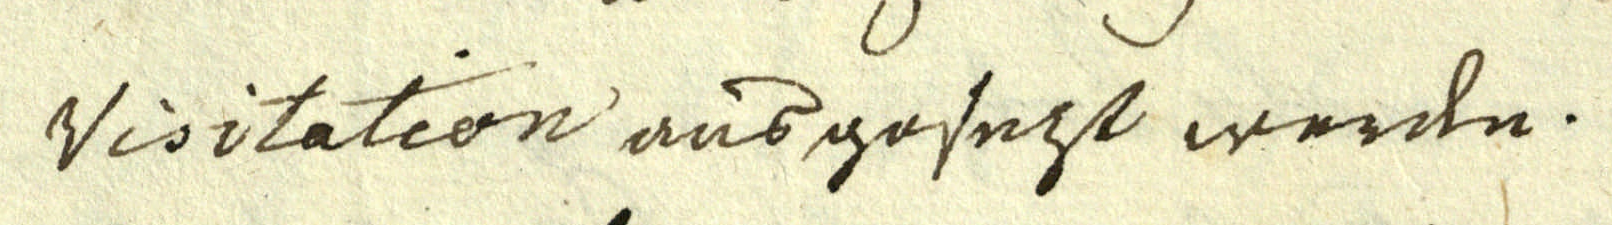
Visitation aus gesezt werden.
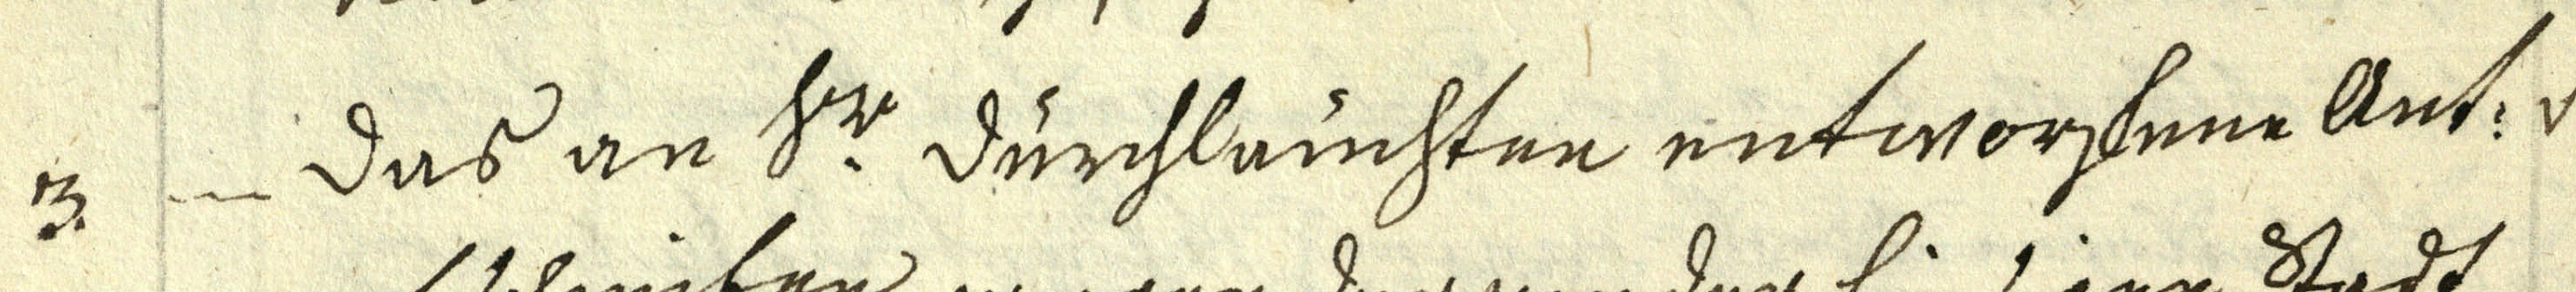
3. Das an Sr Durchlauchten entworfene Ant¬
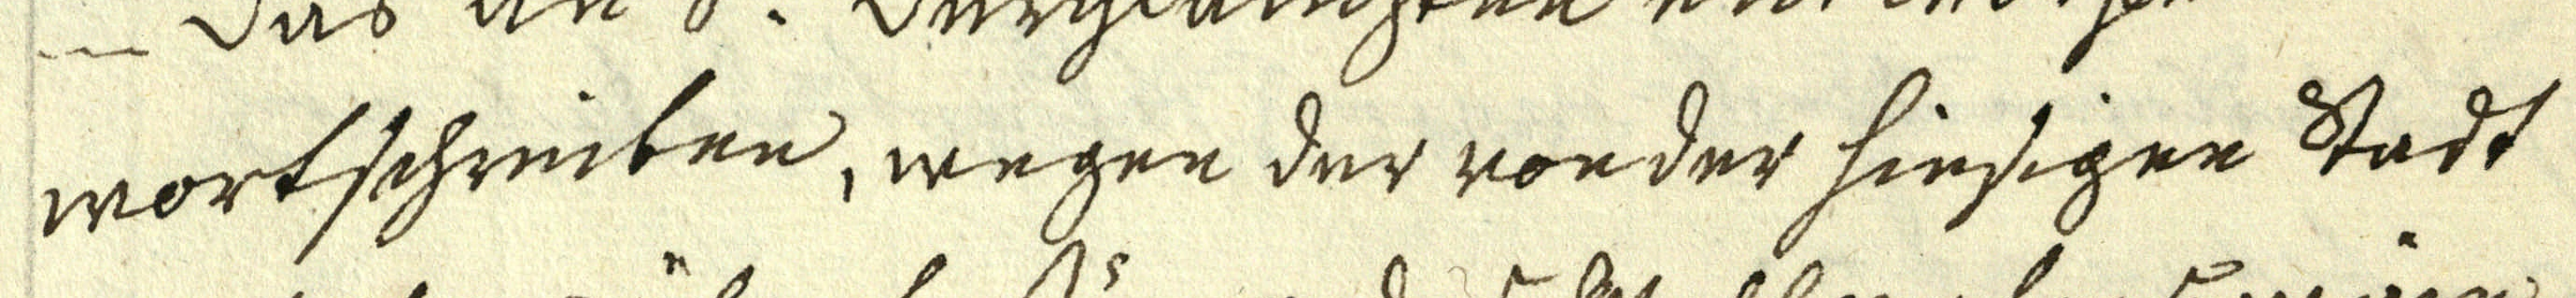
wortschreiben, wegen der von der hiesigen Stadt
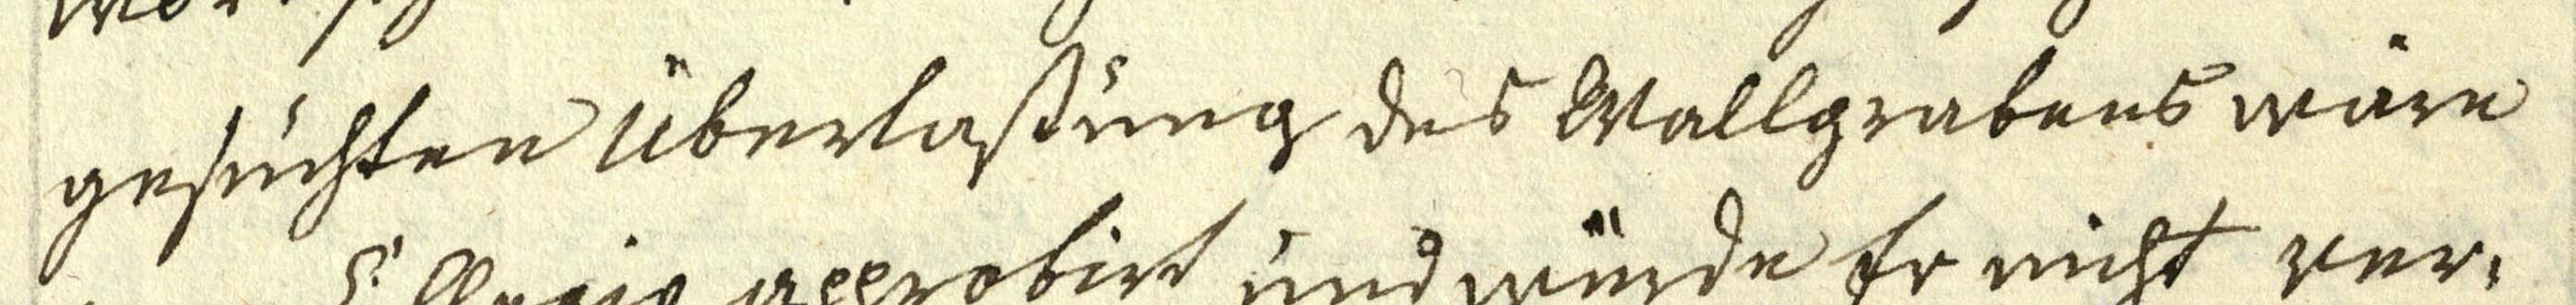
gesuchten Überlaßung des Wallgrabens wäre
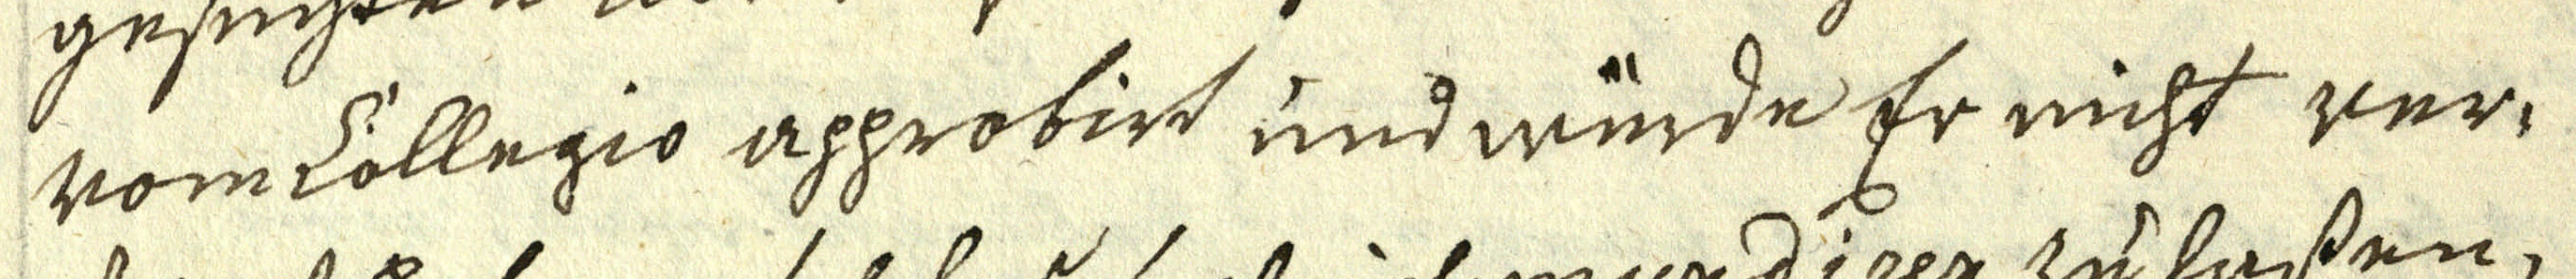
vom Collegio approbirt und würde Er nicht ver¬
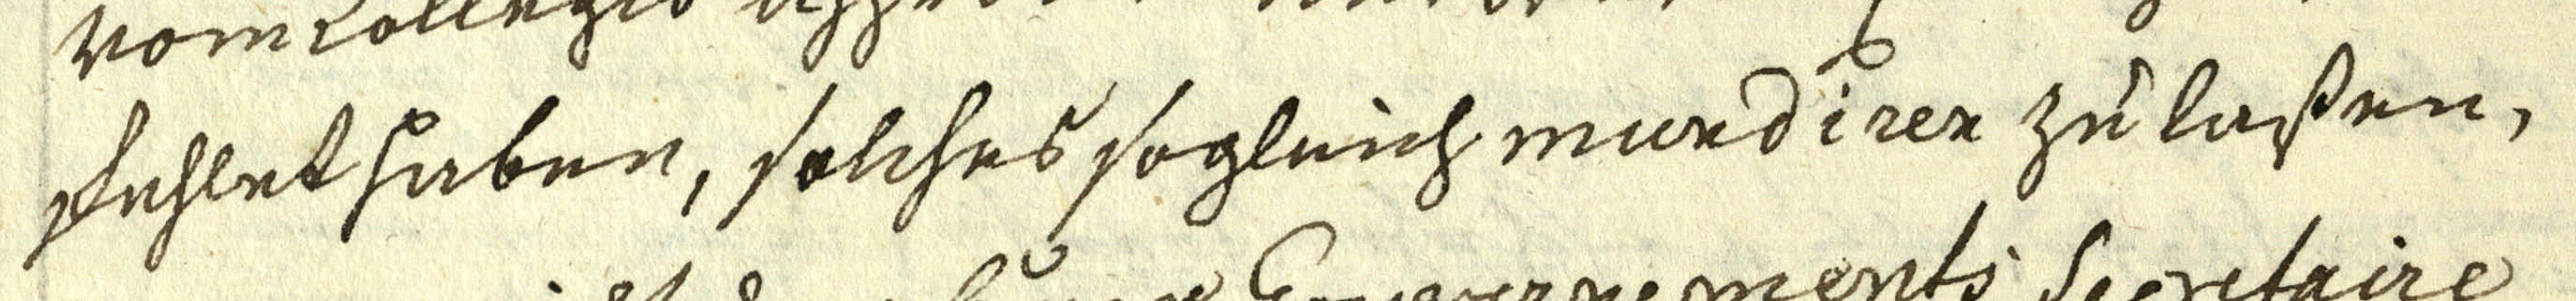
fehlet haben, solches sogleich mundiren zu laßen,
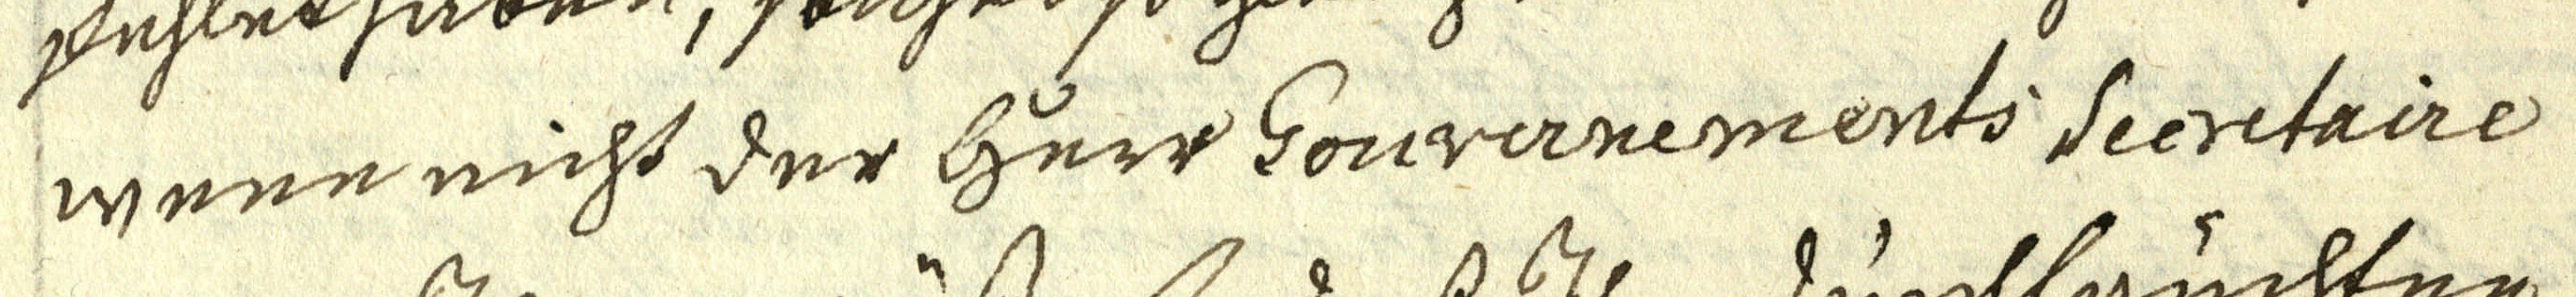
wenn nicht der Herr Gouvernements Secretaire
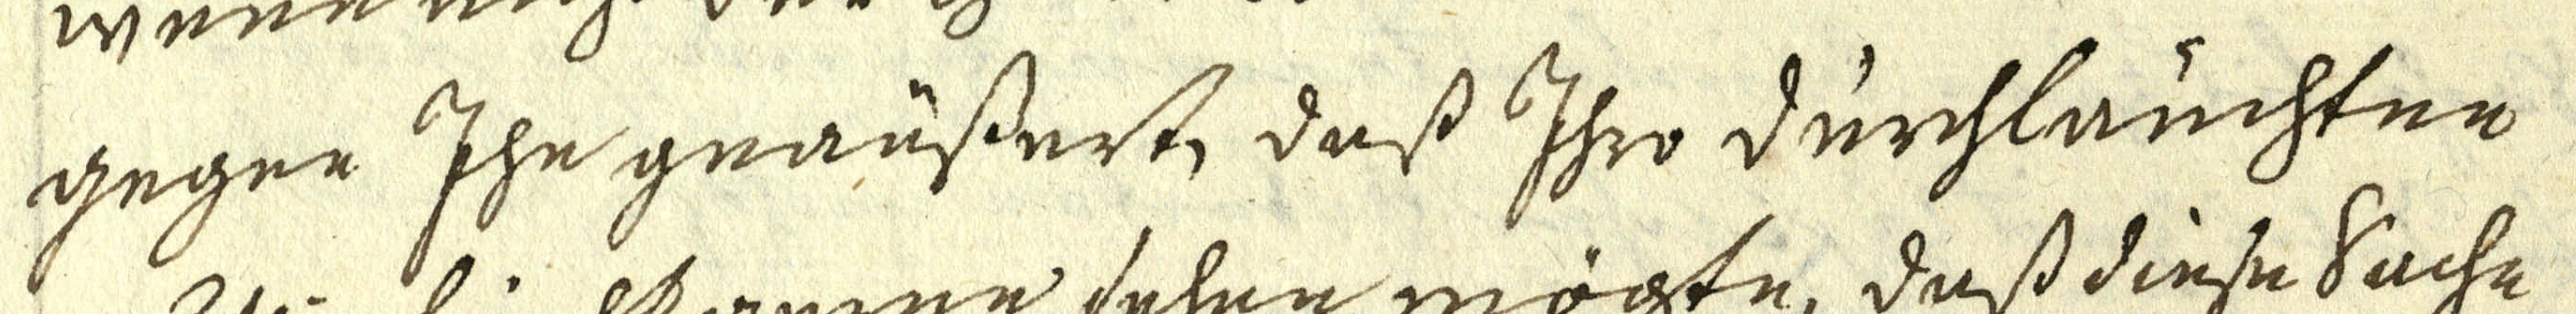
gegen Ihn geäußert, daß Ihro Durchlauchten
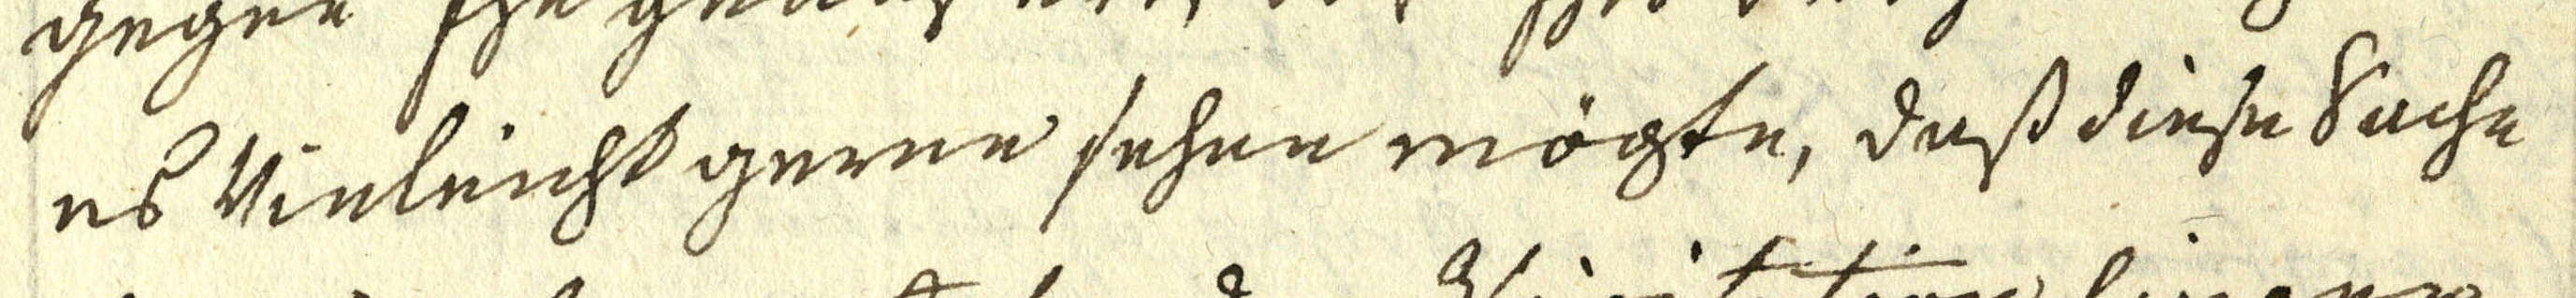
es vieleicht gerne sehen mögte, daß diese Sache
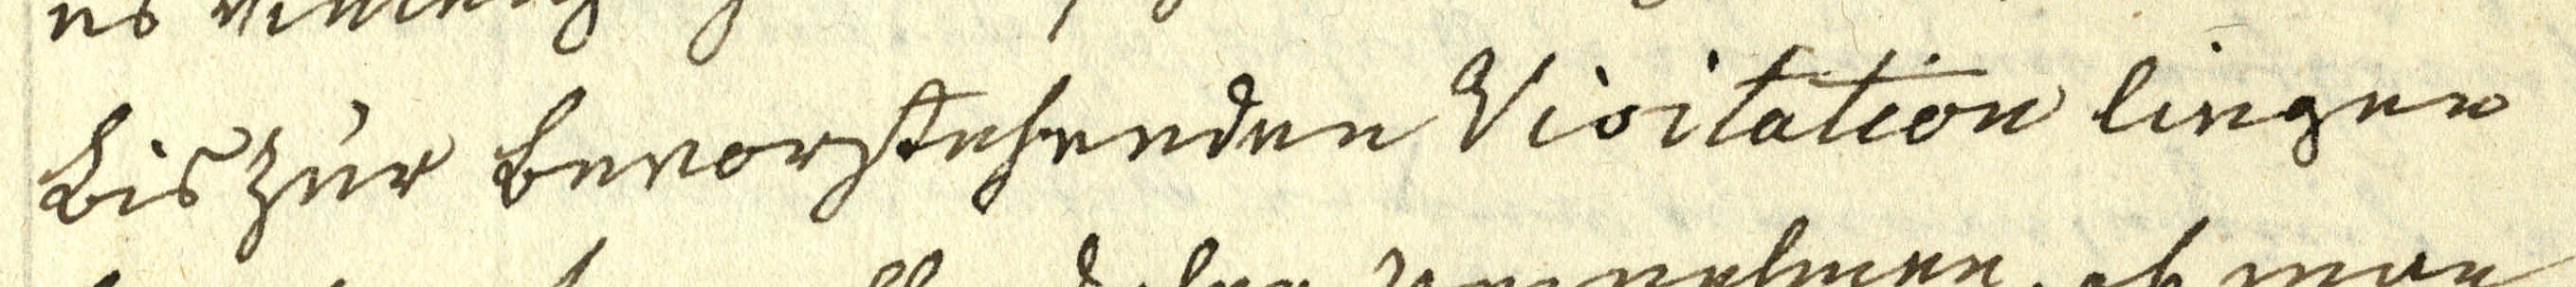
bis zur bevorstehenden Visitation liegen
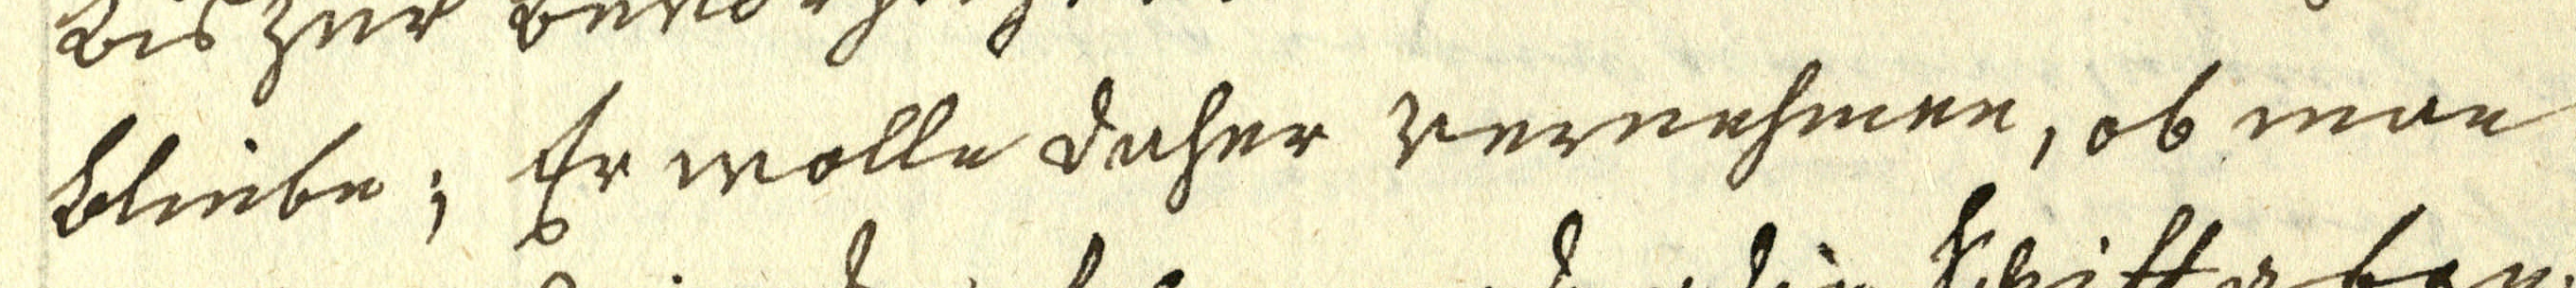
bleibe; Er wolle daher vernehmen, ob man
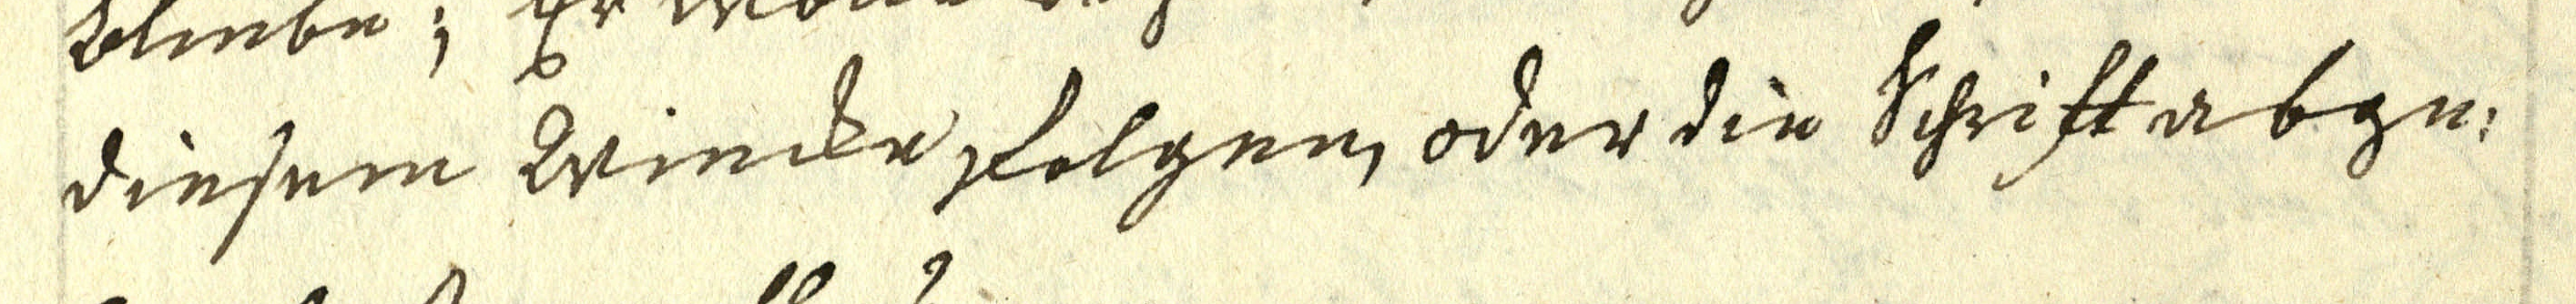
diesem Winke folgen, oder die Schrift abge¬
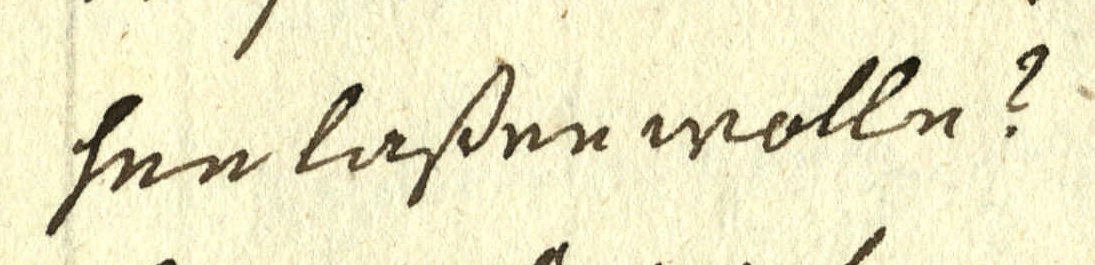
hen laßen wolle?
